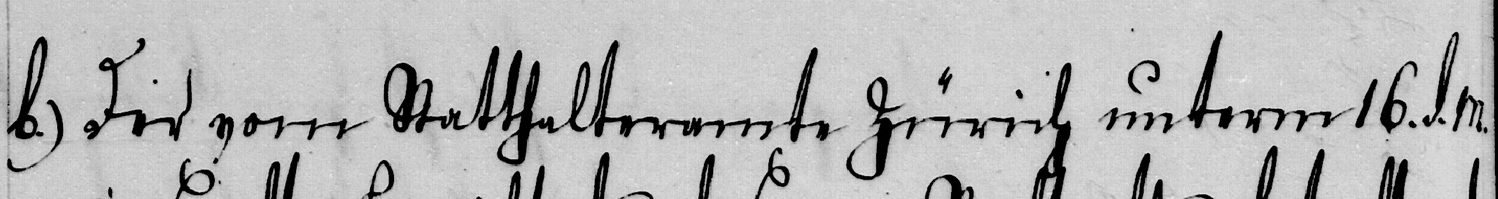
b.) Der vom Statthalteramte Zürich unterm 16. d.
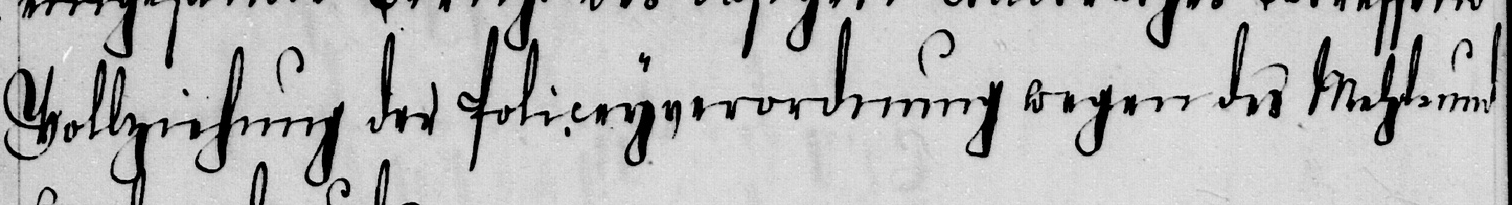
Vollziehung der Policeyverordnung wegen des Mehl- und
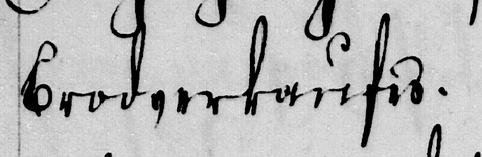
Brodverkaufes.
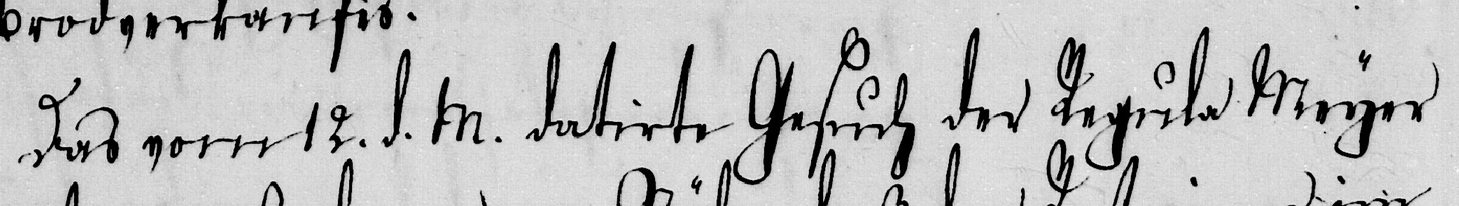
Das vom 12. d. M. datirte Gesuch der Regula Meyer
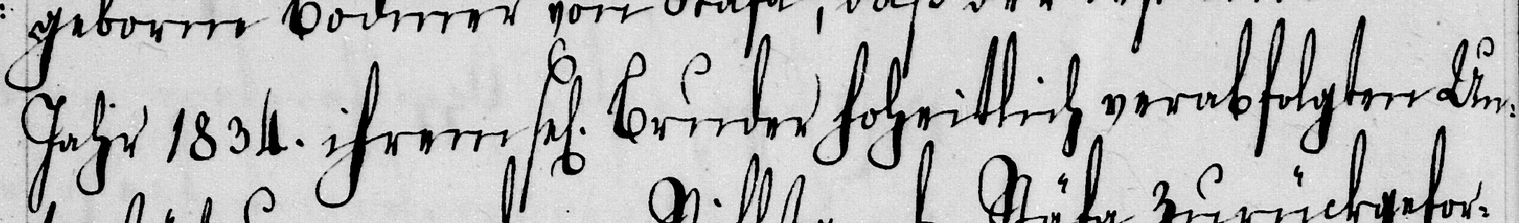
Jahr 1834. ihrem sel. Bruder hoheitlich verabfolgten Un¬
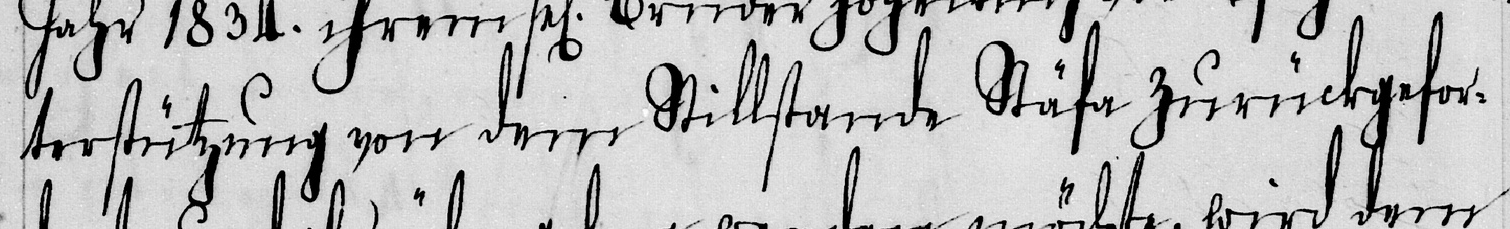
terstützung von dem Stillstande Stäfa zurückgefor¬
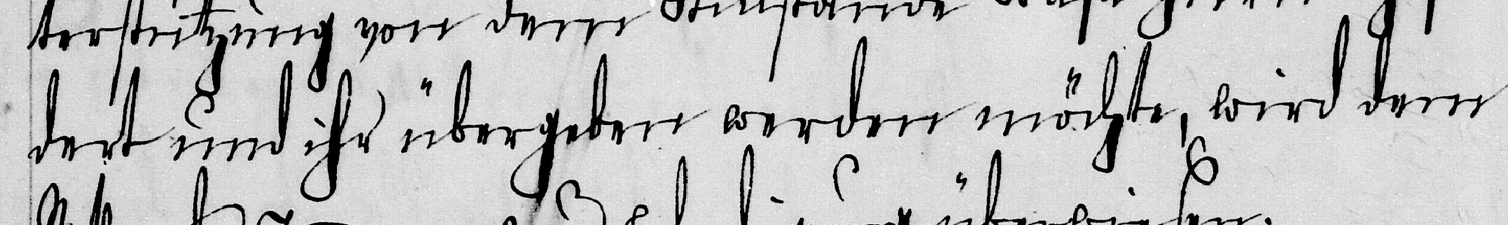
dert und ihr übergeben werden möchte, wird dem
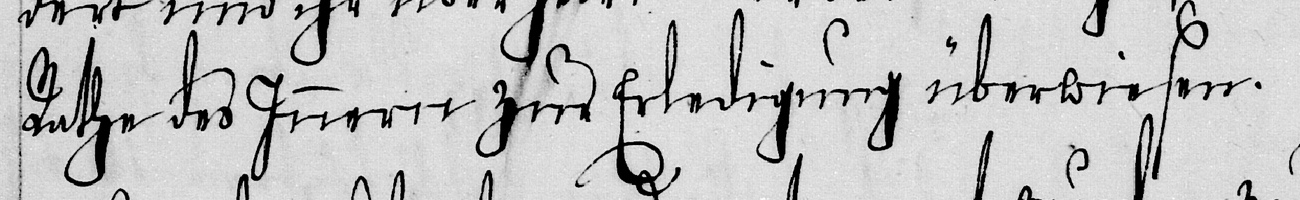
Rathe des Innern zur Erledigung überwiesen.
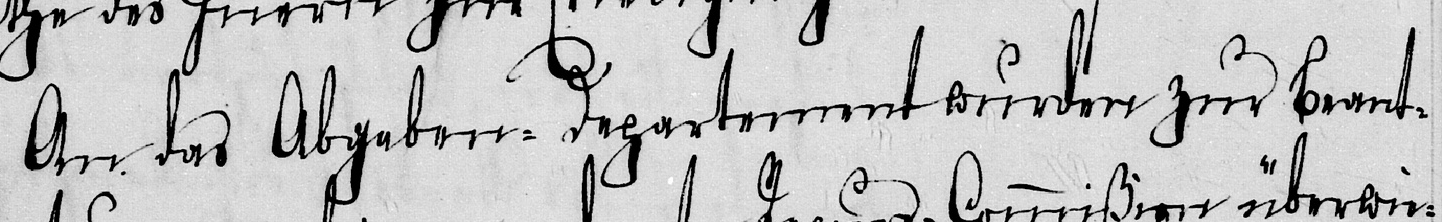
An das Abgaben-Departement wurden zur Beant¬
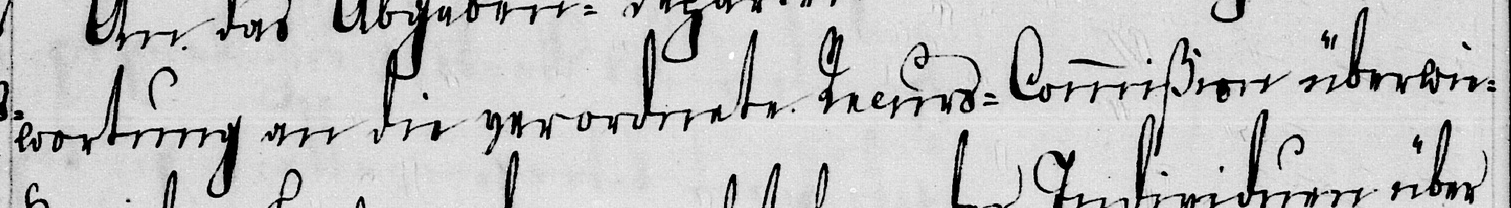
wortung an die verordnete Recurs-Commißion überwie¬
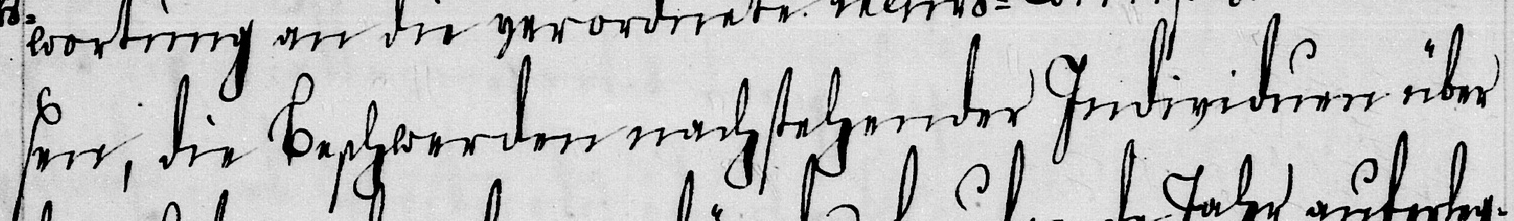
sen, die Beschwerden nachstehender Induviduen über
